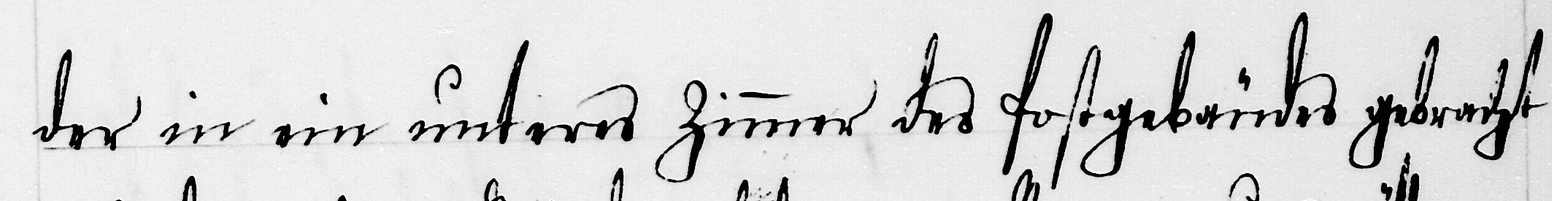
der in ein unteres Zimmer des Postgebäudes gebracht
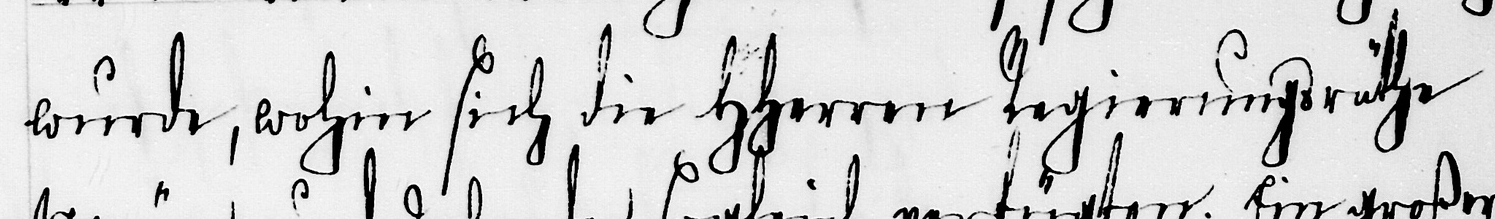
wurde, wohin sich die HHerren Regierungsräthe
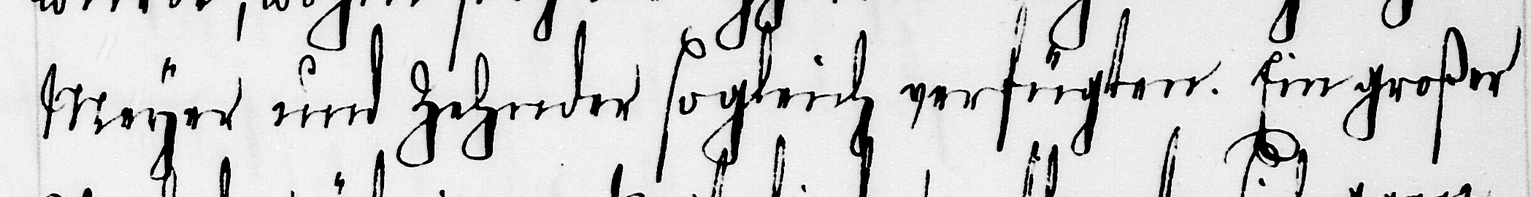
Meyer und Zehnder sogleich verfügten. Ein großer
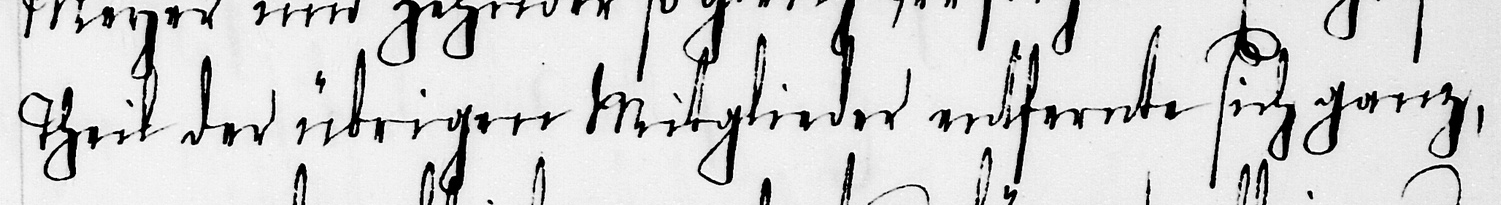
Theil der übrigen Mitglieder entfernte sich ganz,
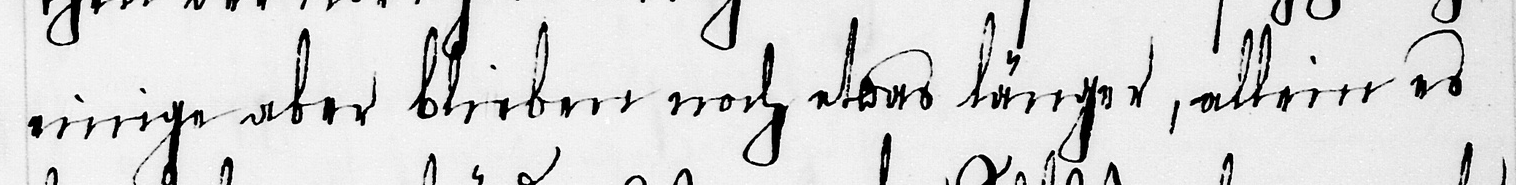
einige aber blieben noch etwas länger, allein es
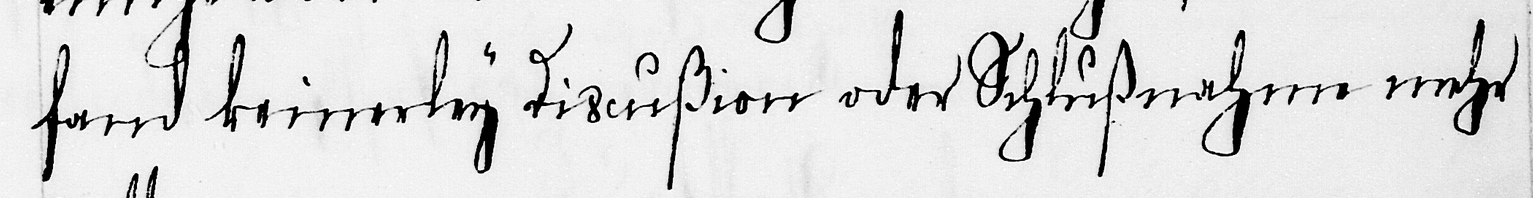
fand keinerley Discußion oder Schlußnahme mehr
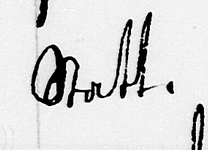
Statt.
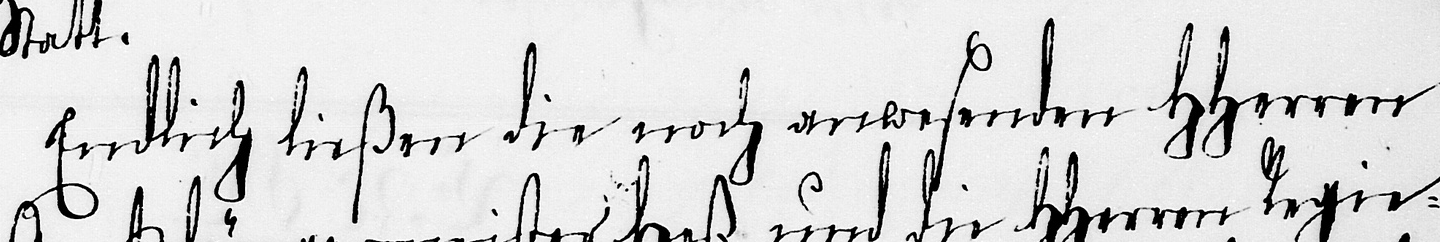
Endlich ließen die noch anwesenden HHerren
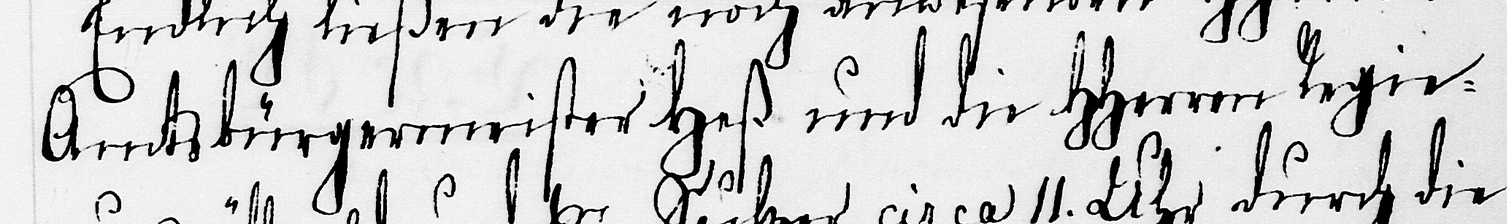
Amtsbürgermeister Heß und die HHerren Regie¬
